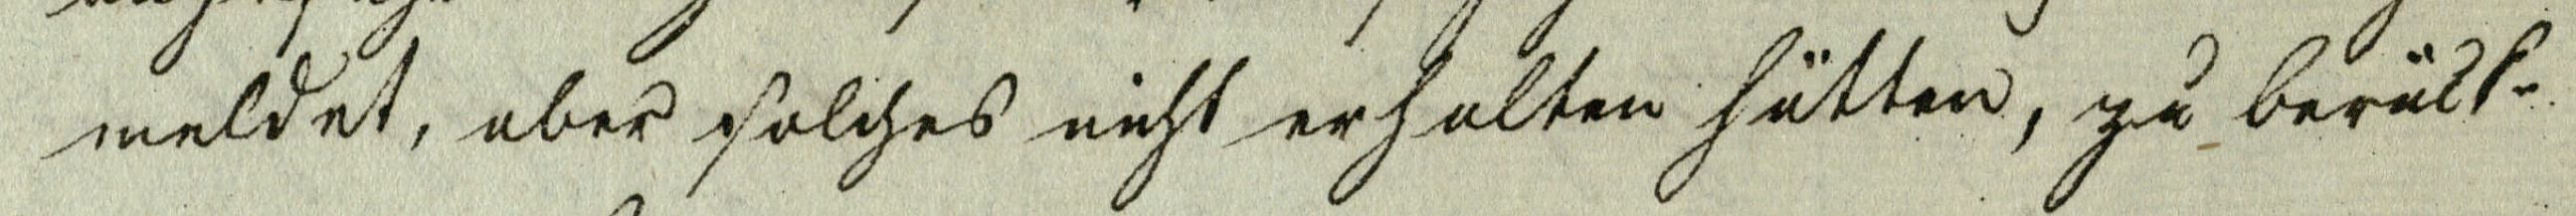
meldet, aber solches nicht erhalten hätten, zu berück¬
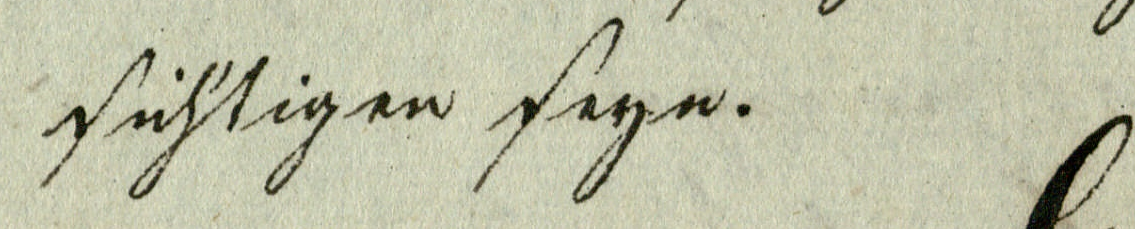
sichtigen seyn.
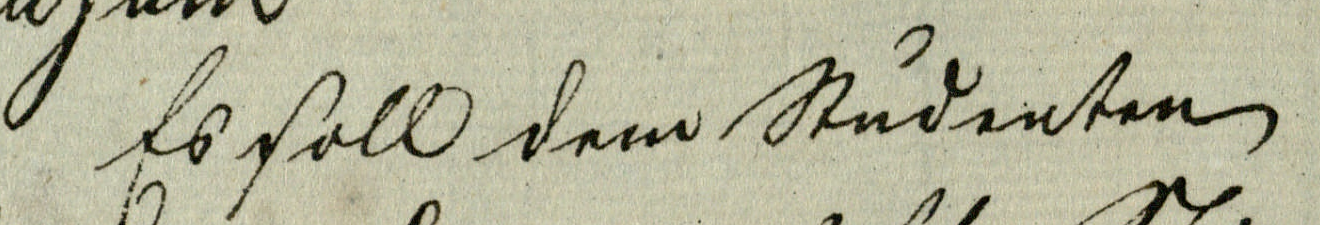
Es soll dem Studenten
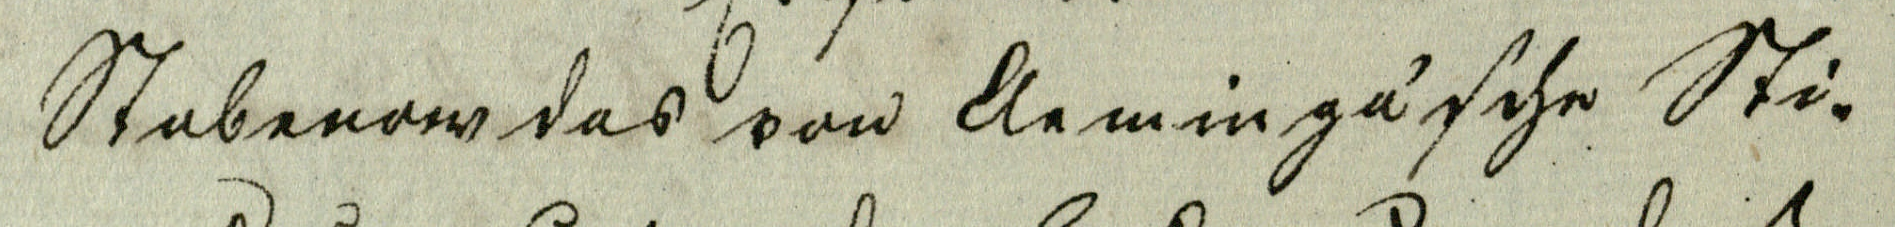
Stabenow das von Aeminga'sche Sti¬
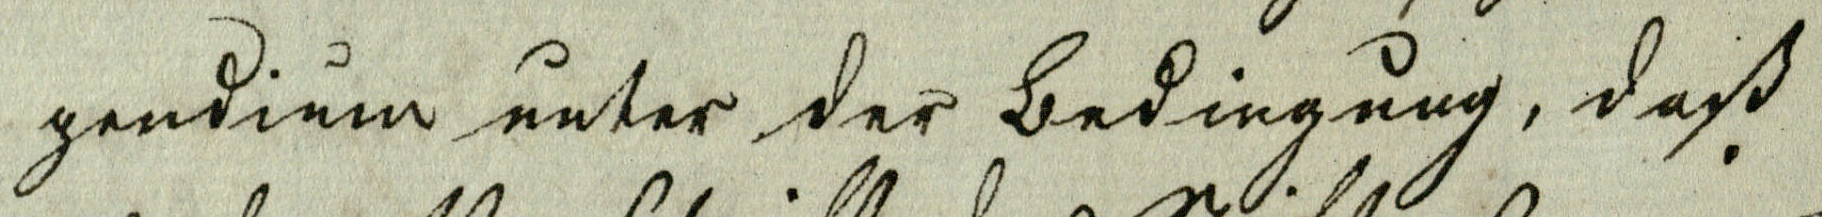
pendium unter der Bedingung, daß
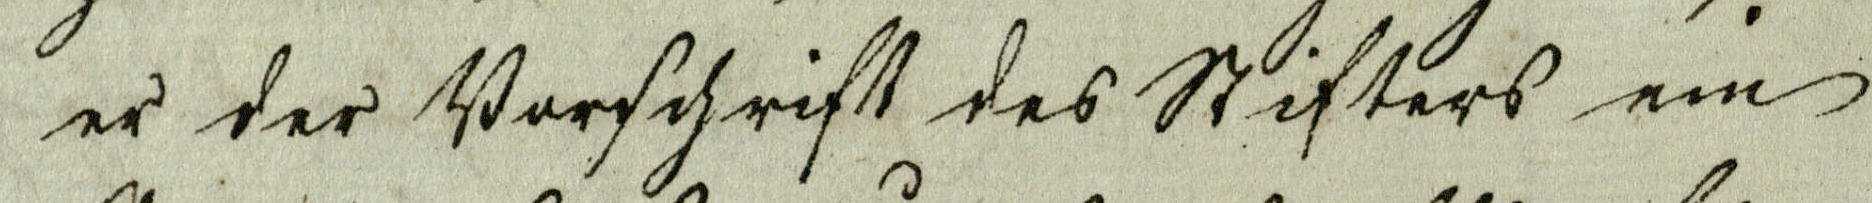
er der Vorschrift des Stifters ein
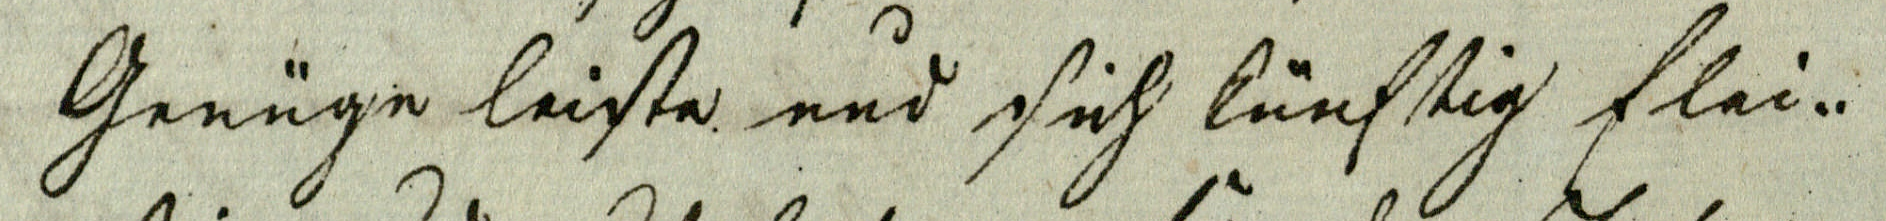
Genüge leiste und sich künftig flei¬
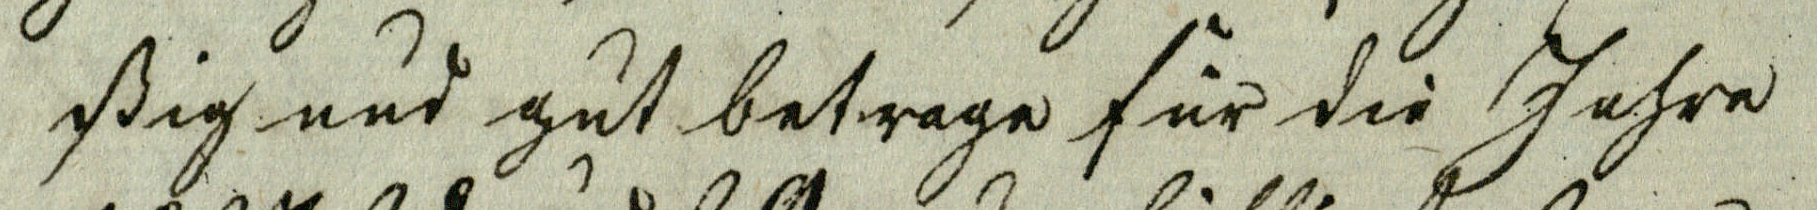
ßig und gut betrage für die Jahre
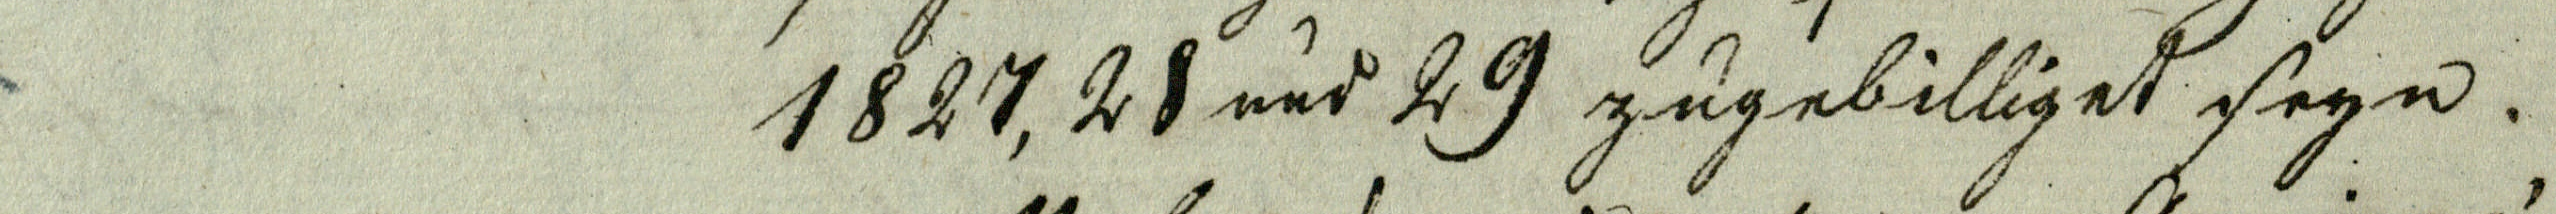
1827, 28 und 29 zugebilliget seyn.
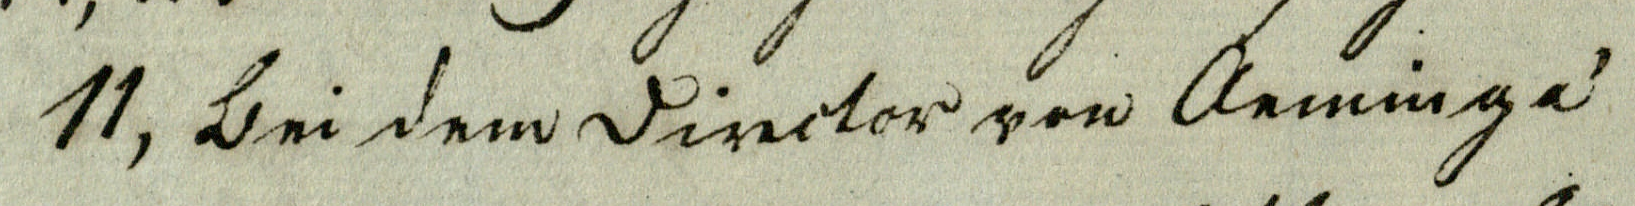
11, Bei dem Director von Aeminga'¬
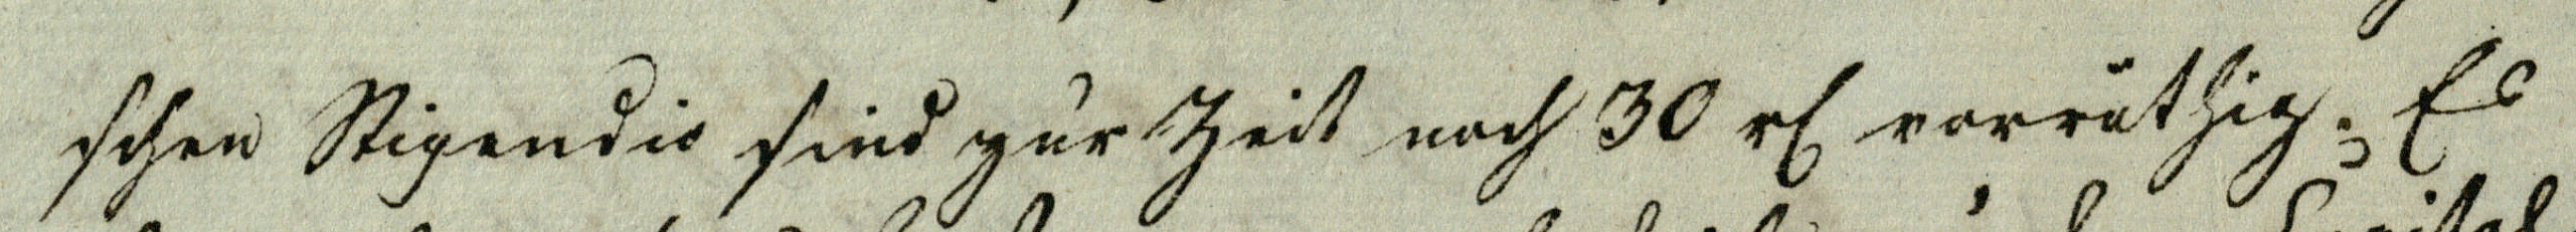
schen Stipendio sind zur Zeit noch 30 r vorräthig. Es
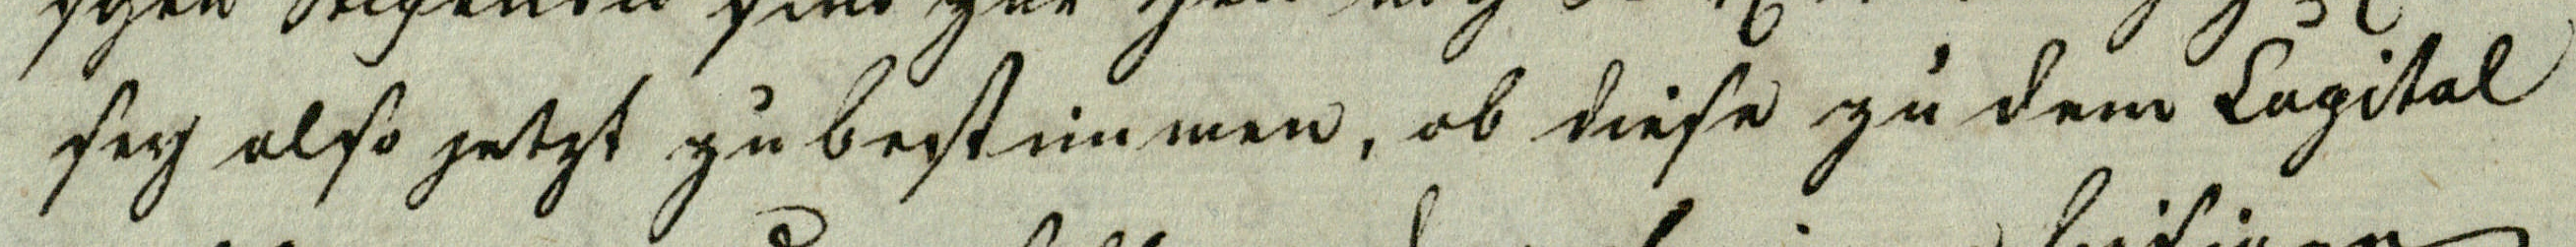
sey also jetzt zu bestimmen, ob diese zu dem Capital
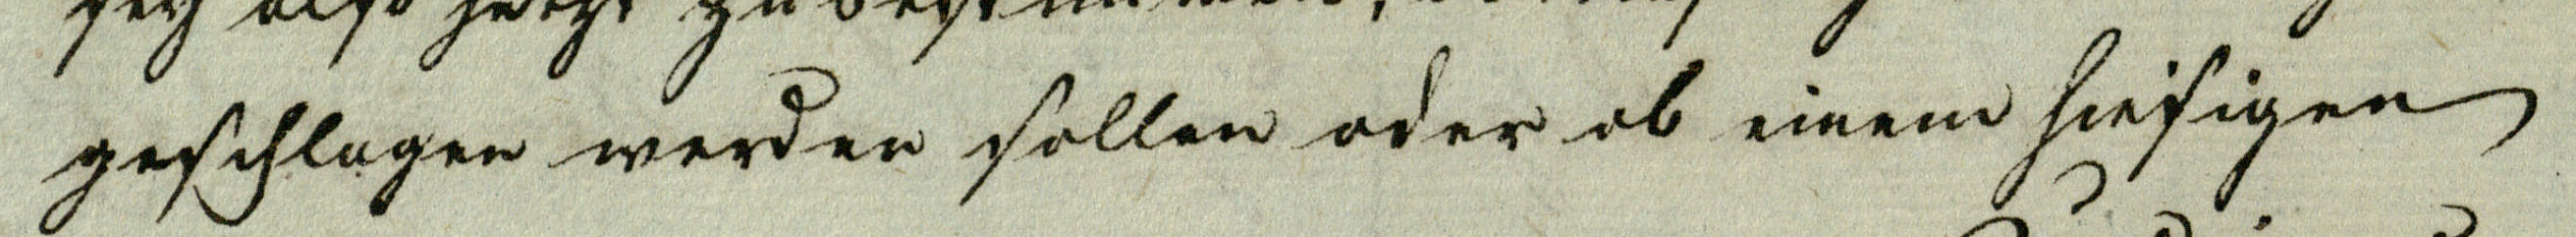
geschlagen werden sollen oder ob einem hiesigen
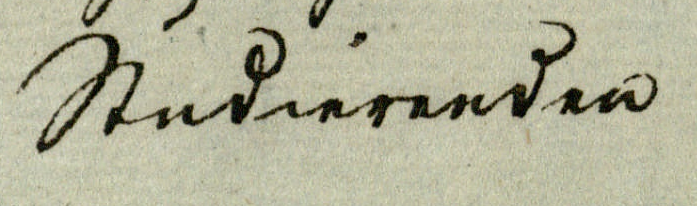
Studierenden
